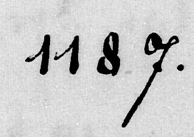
1187.
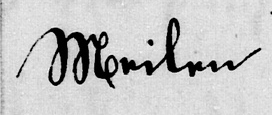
Meilen
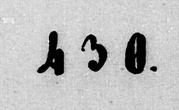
430.
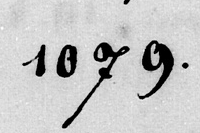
1079.
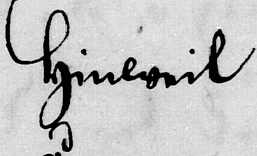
Hinweil
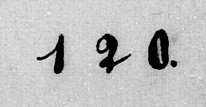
120.
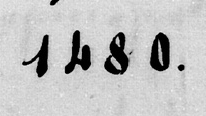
1480.
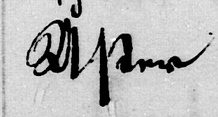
Uster
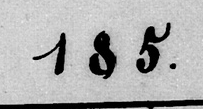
185.
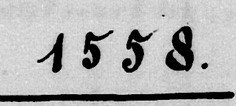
1558.
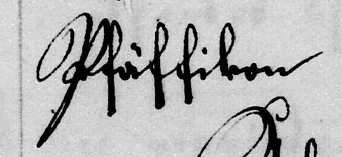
Pfäffikon
